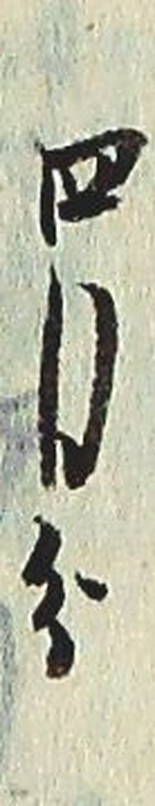四月分
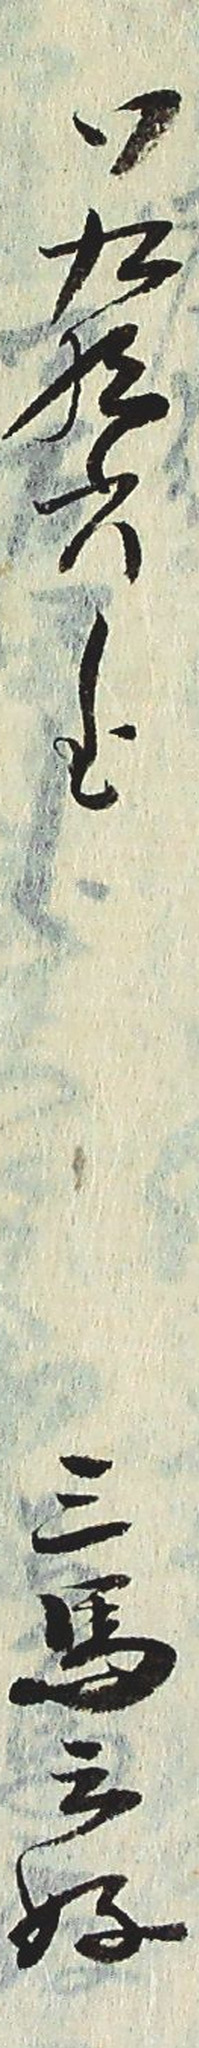同九拾六匁三馬三好
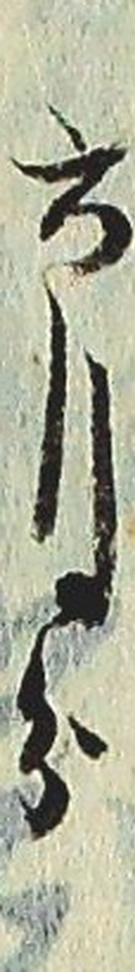六月分
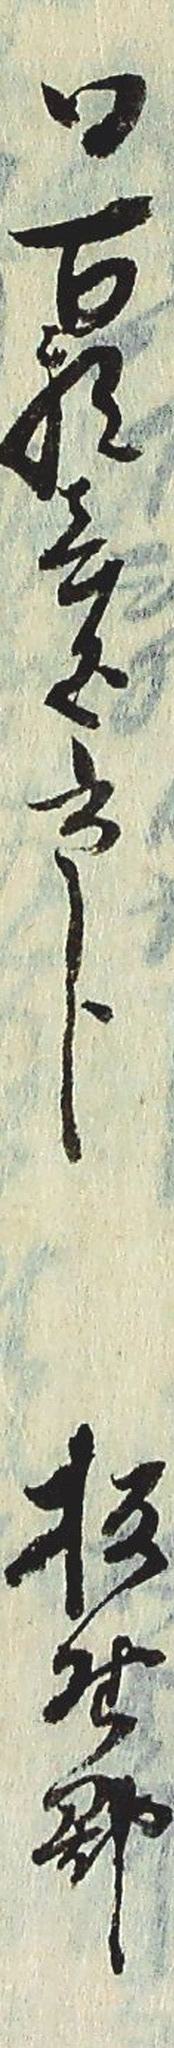同百拾壱匁六分板野郡
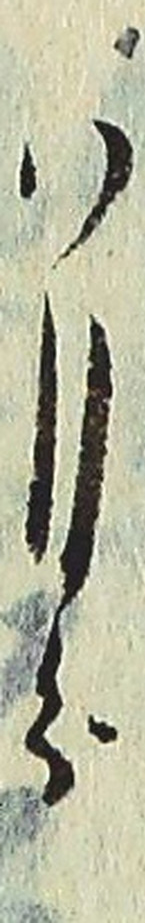八月分
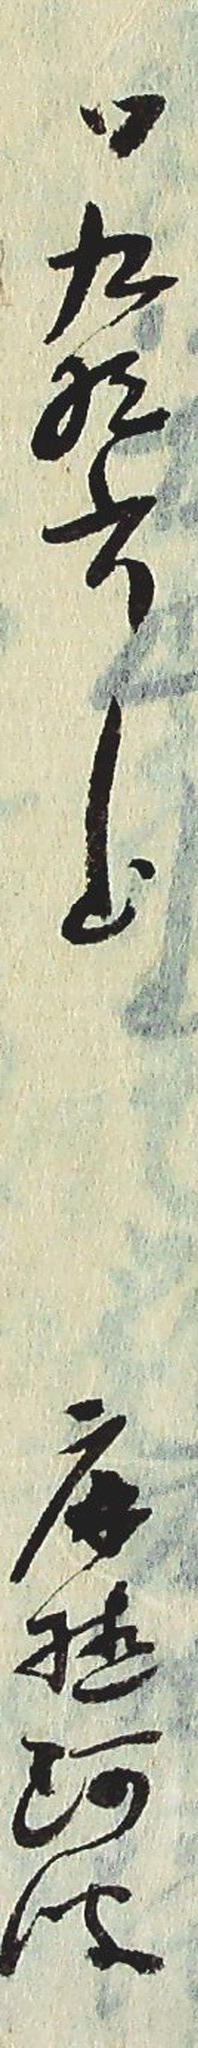同九拾六匁麻植阿波
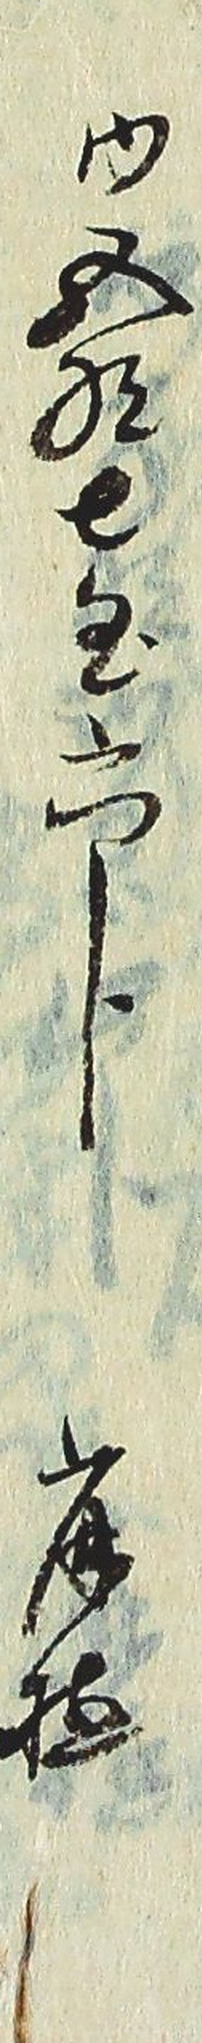内五拾七匁六分麻植
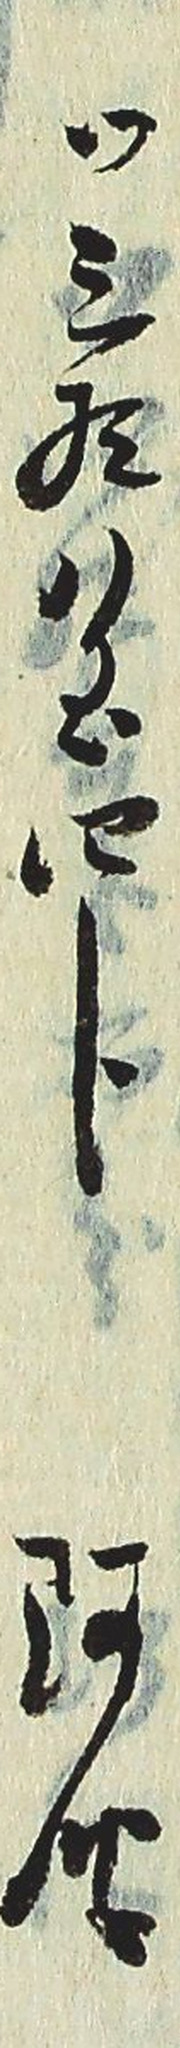同三拾八匁四分阿波
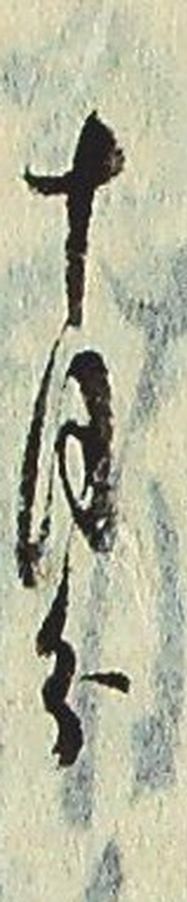十月分
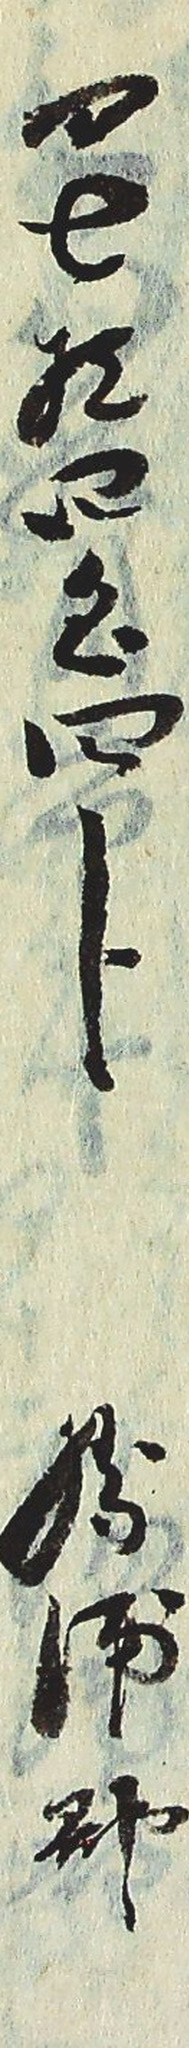同七拾四匁四分勝浦郡
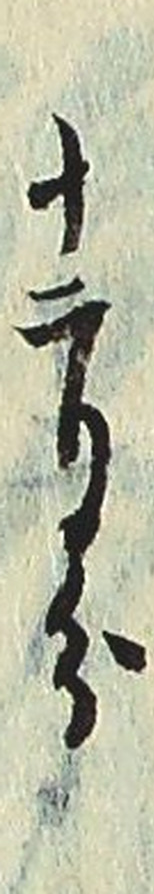十二月分
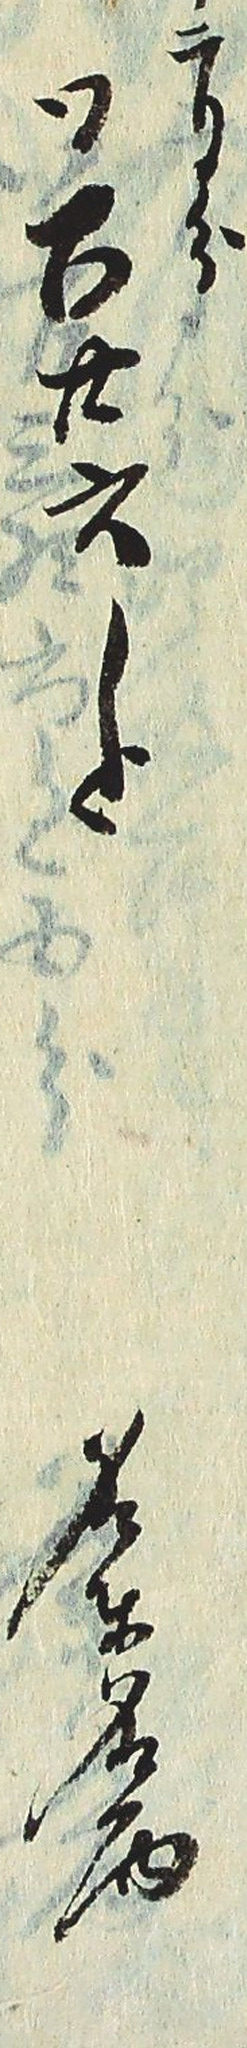同百廿六匁名東名西
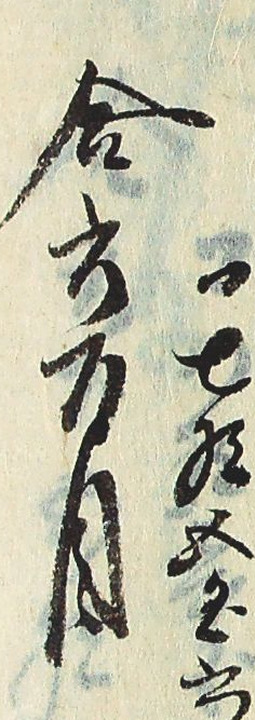合六百目

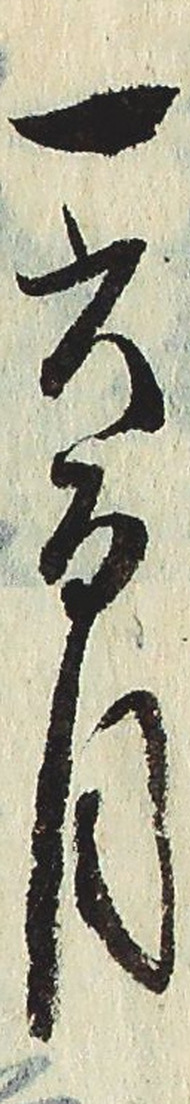一六百目
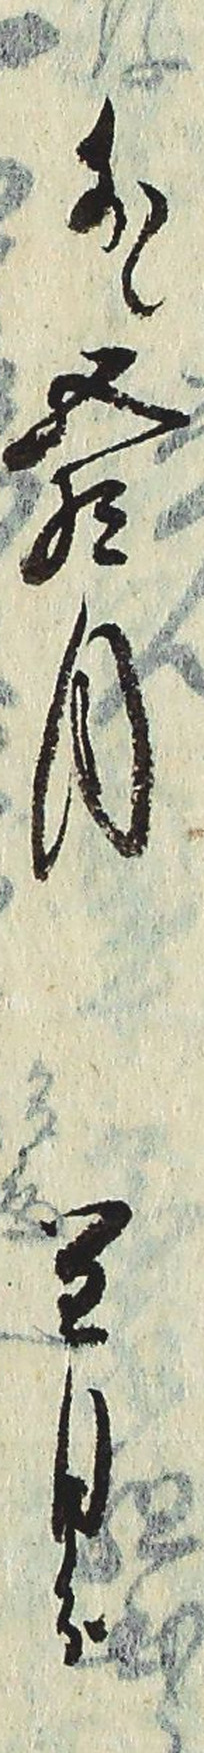外に五拾目閏月分
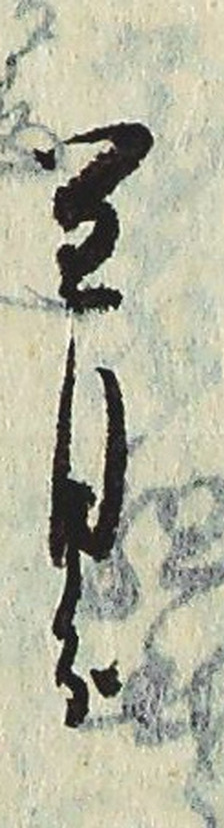二月分
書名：名東郡中諸割賦元帳
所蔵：鳴門教育大学 Naruto University of Education
